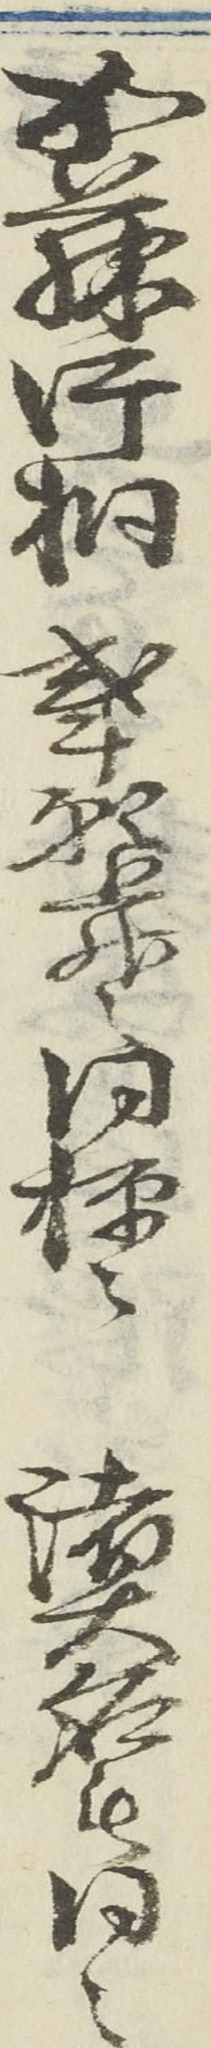加藤片桐奉願上升ニ同様也諸大名も同也
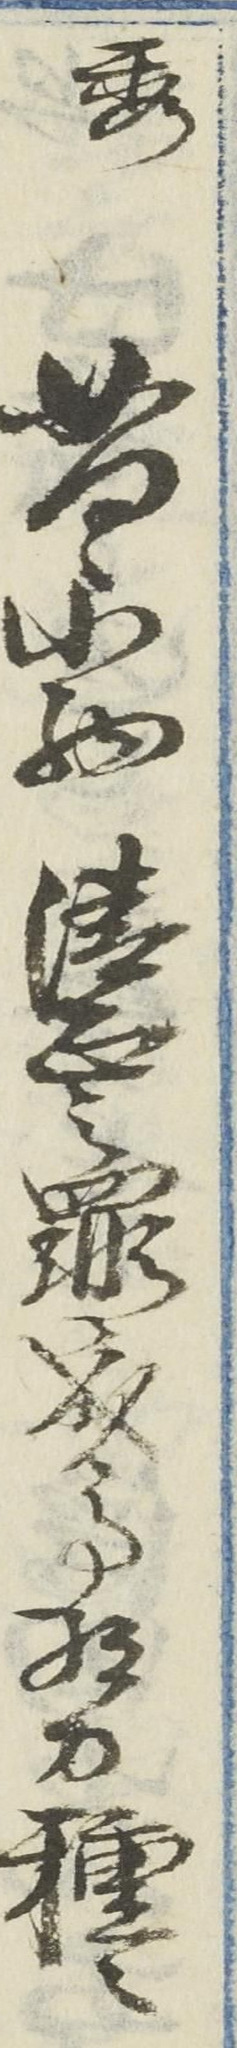秀如何ニ小西清正之罪ニ成ル事有カ種〻
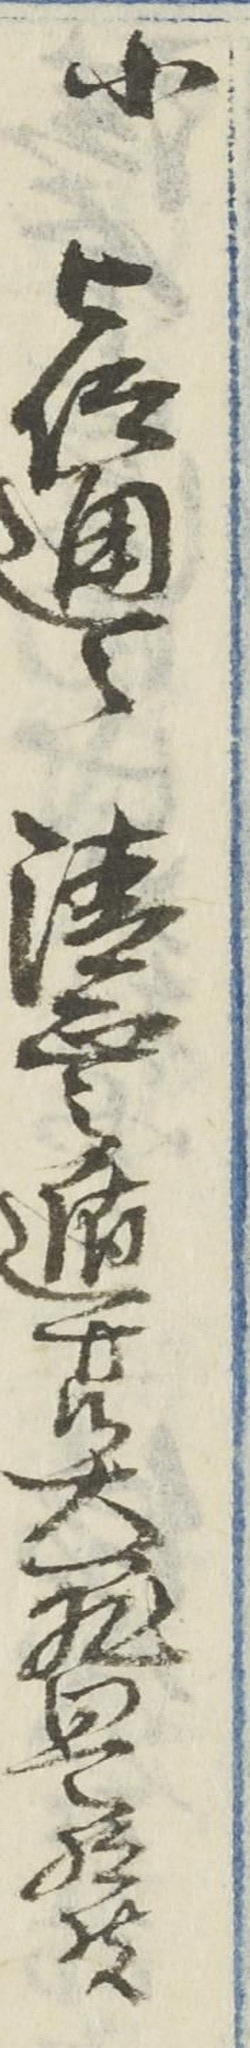小被仰通也清正之遁サル大罪是有候
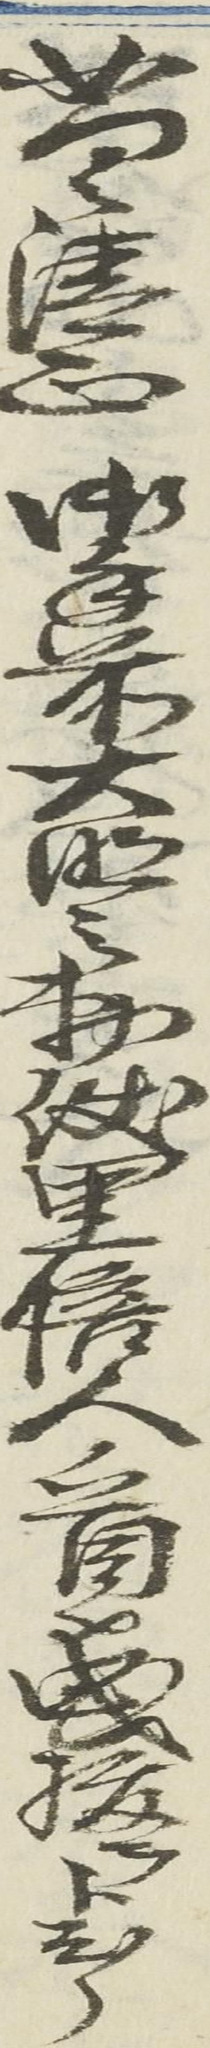如何ニ清正御手前大明之勅使里倍人ノ首ヲ曳抜テト云ウ
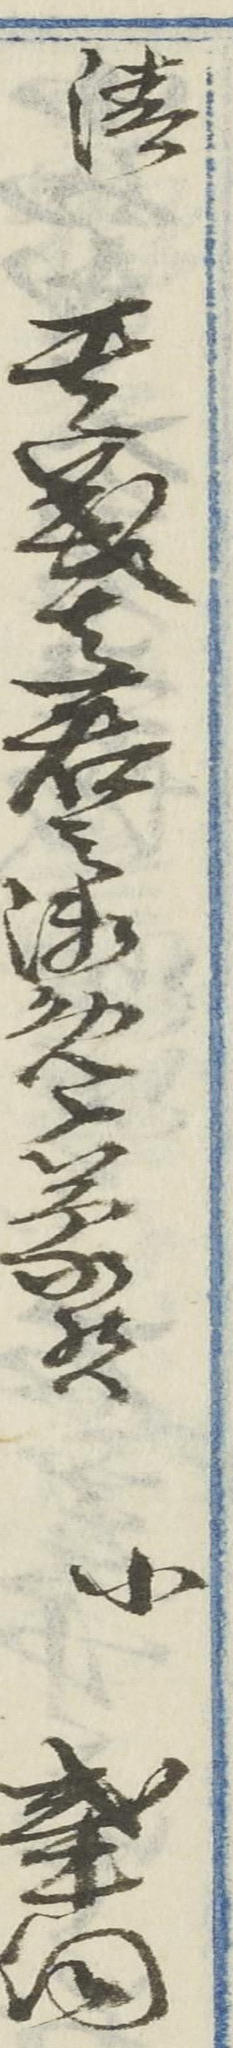清其義は君之御免ヲ蒙候小奉伺
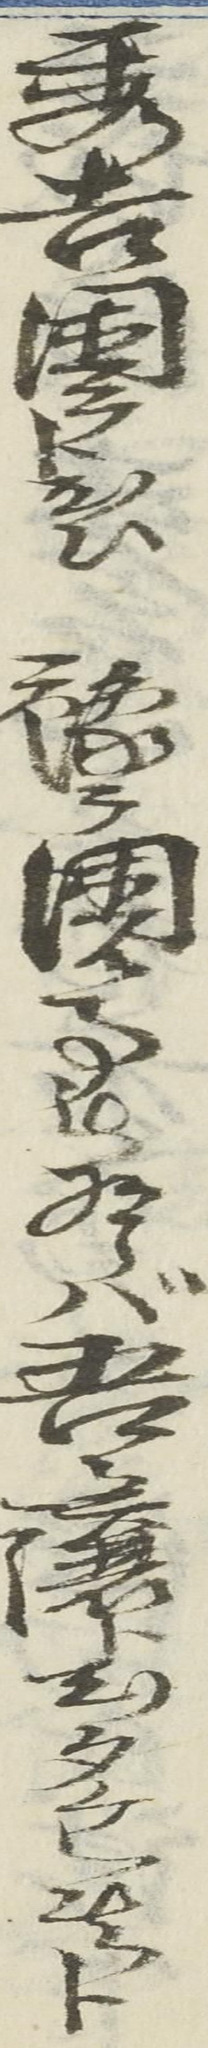秀吉困テト云ひ豫テ困ル事も有ラバ吾ニ譲ト云タケレ共ト
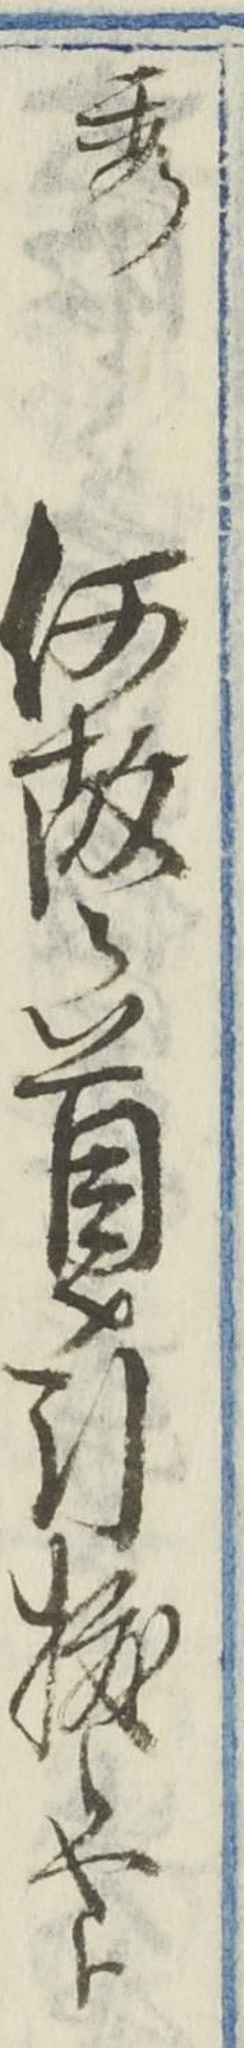秀何故ニ首ヲ引抜シヤト
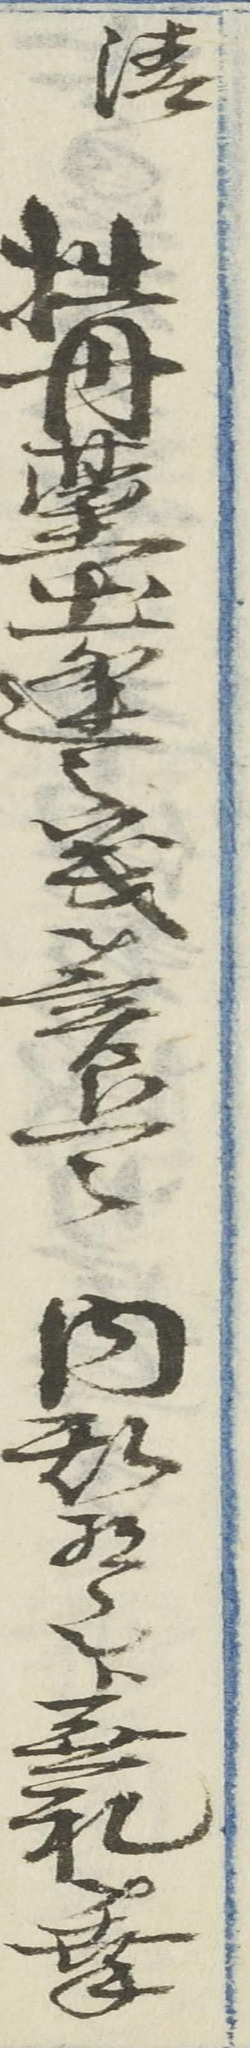清牡丹菫出逢之義ヲ言上也内乱有リシト無礼ヲ幸
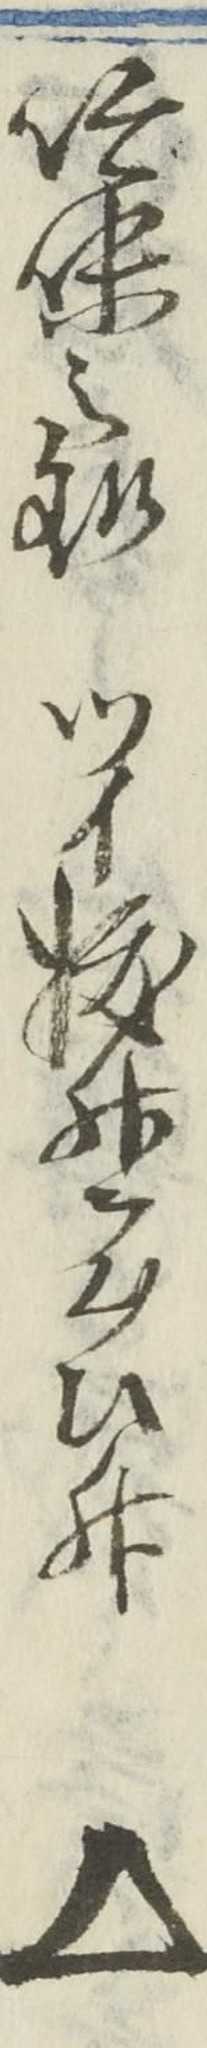吟味之処ツイ抜升テ云ひ升△
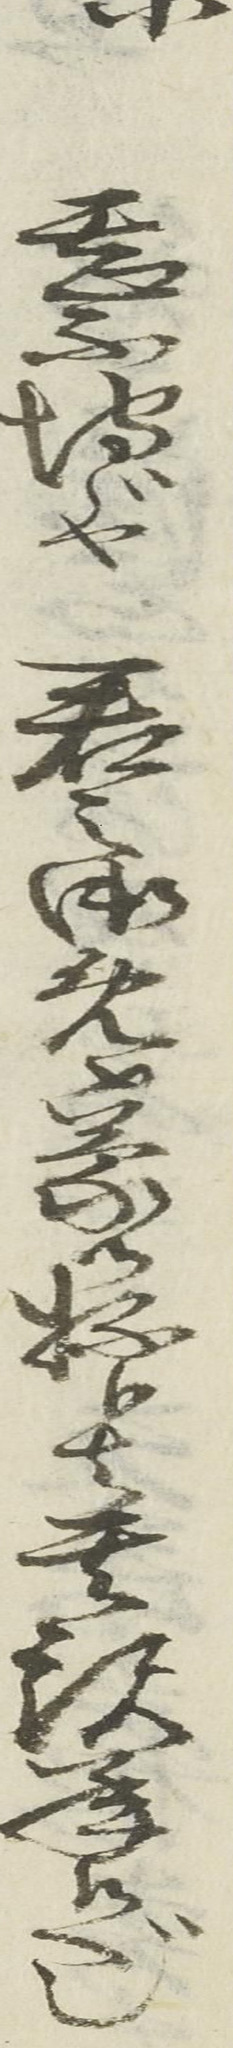小甚不埒ジヤ君之御免ヲ蒙ル抔トは其訳承ルベシ
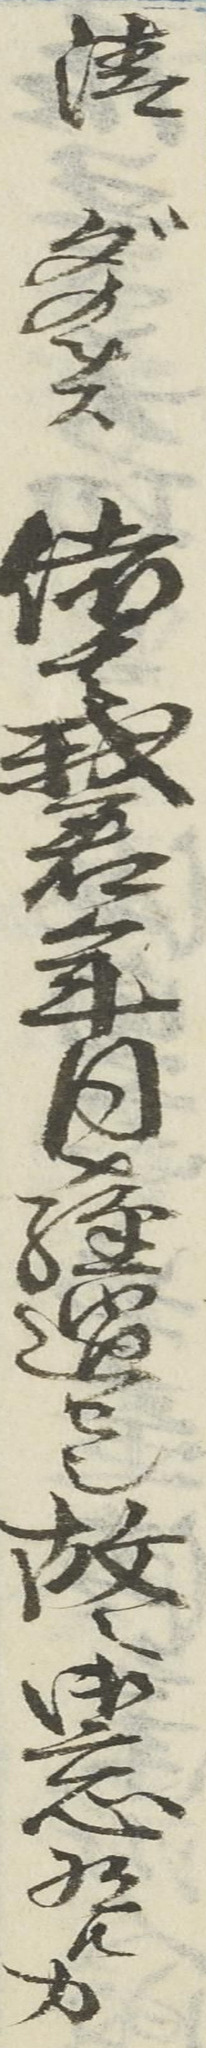清ダメヲス偖は我君年月ヲ経過セシ故ニ御忘有ルカ
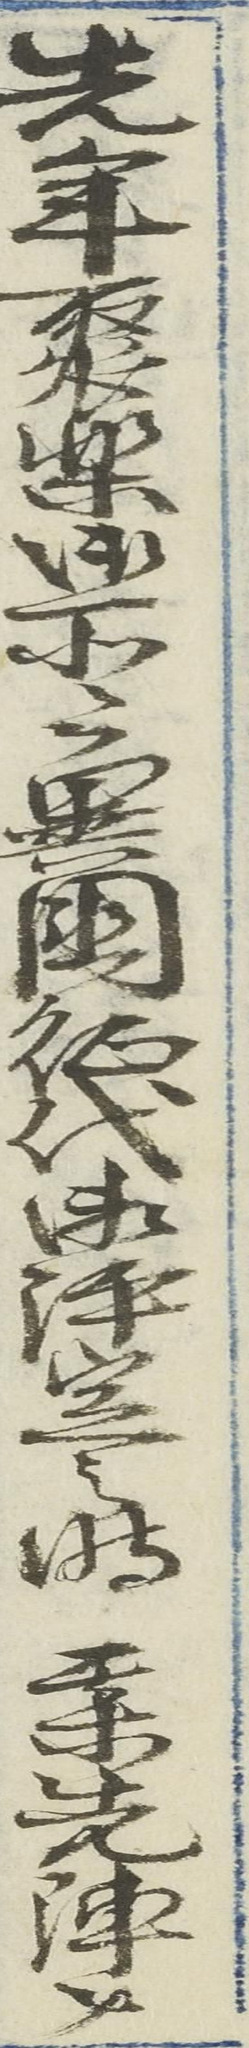先年聚楽御所ニテ異国征代御評定之時某先陣ヲ
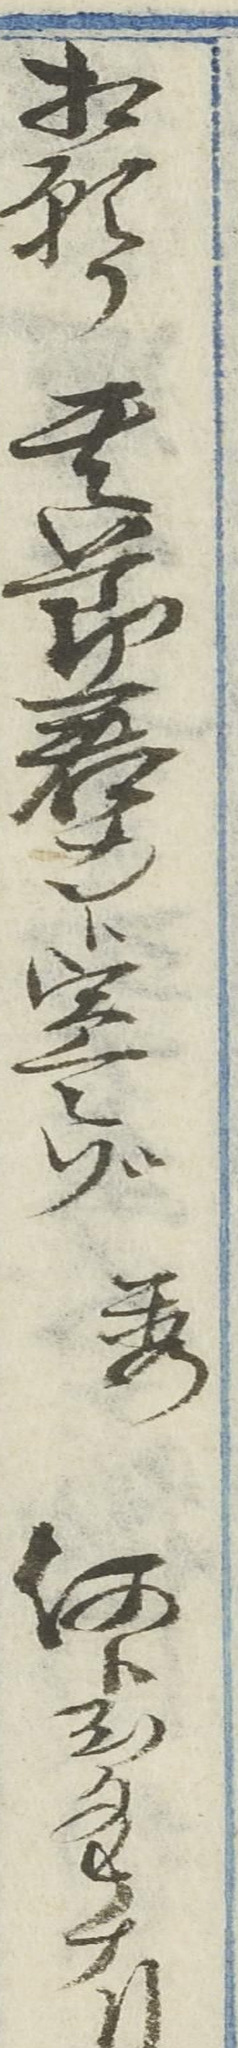相願ウ其節君ナント宣シゾ秀何ト云タヒチ
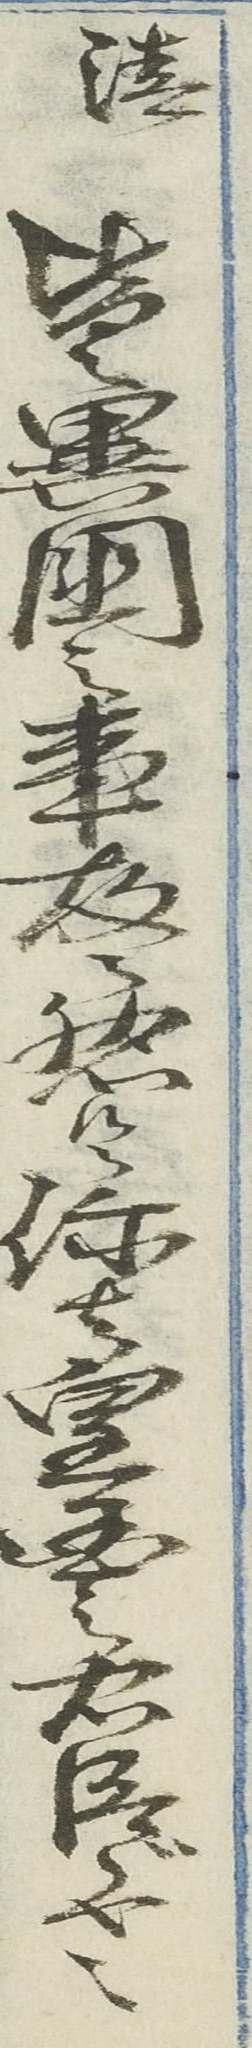清皆々異国之事故ニ然ルニ你は皇国之忠臣ジヤ也
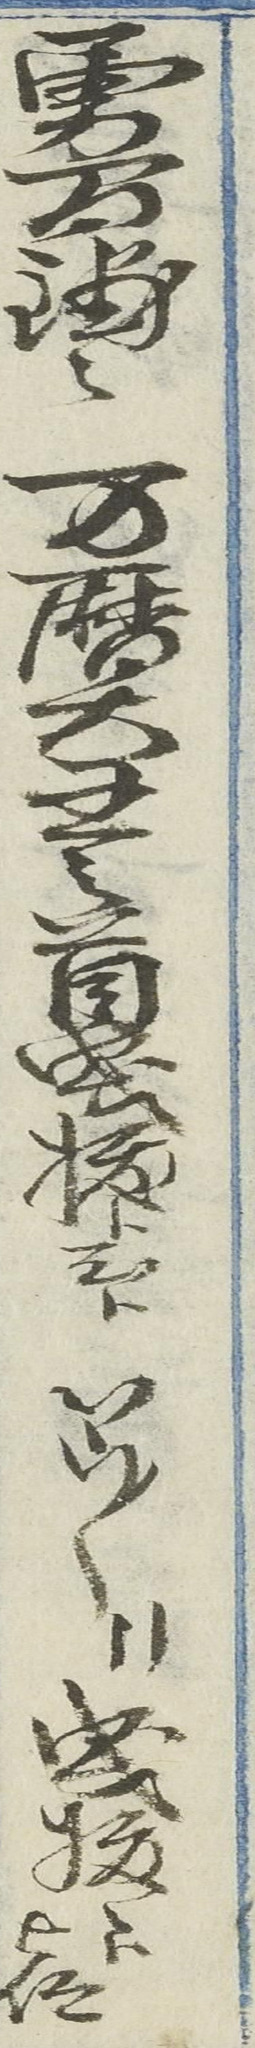勇間舗ニ万歴大王之首曳抜ト云トソウ〳〵曳抜ニト被仰
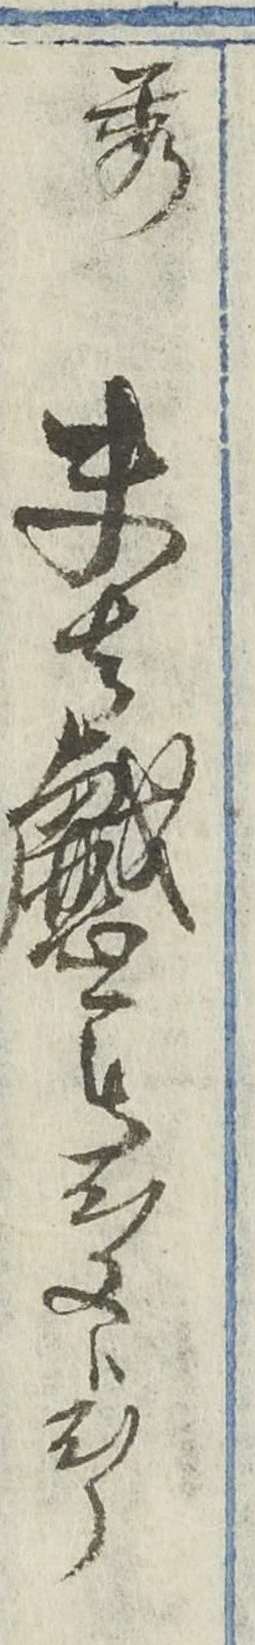秀夫は戯とも云ヌト云ウ
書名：伏水大地震
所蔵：東京大学地震研究所図書室 Earthquake Research Institute Library, The University of Tokyo, JAPAN
